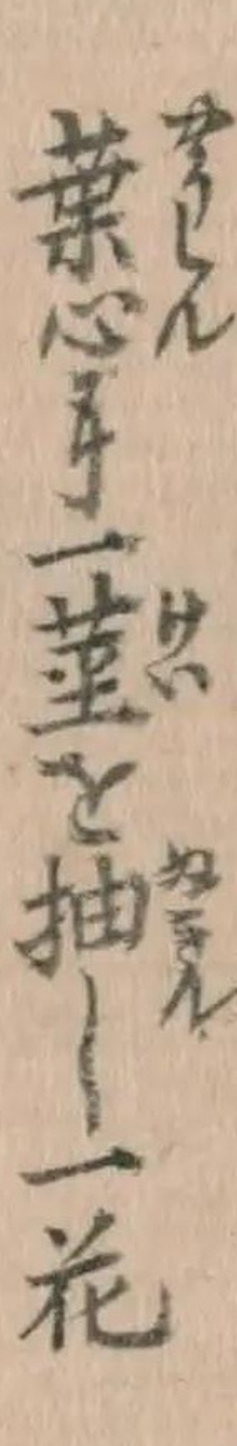葉心に一茎を抽し一花
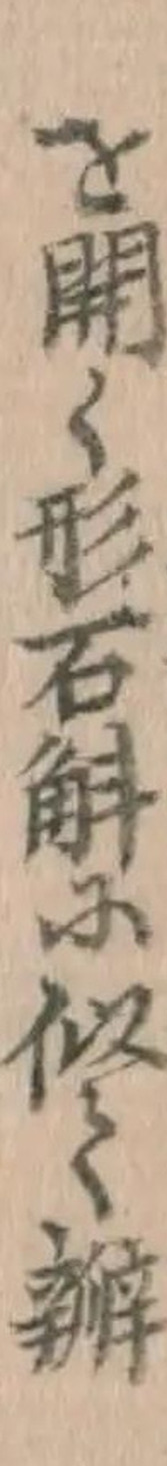を開く形石斛に似て弁
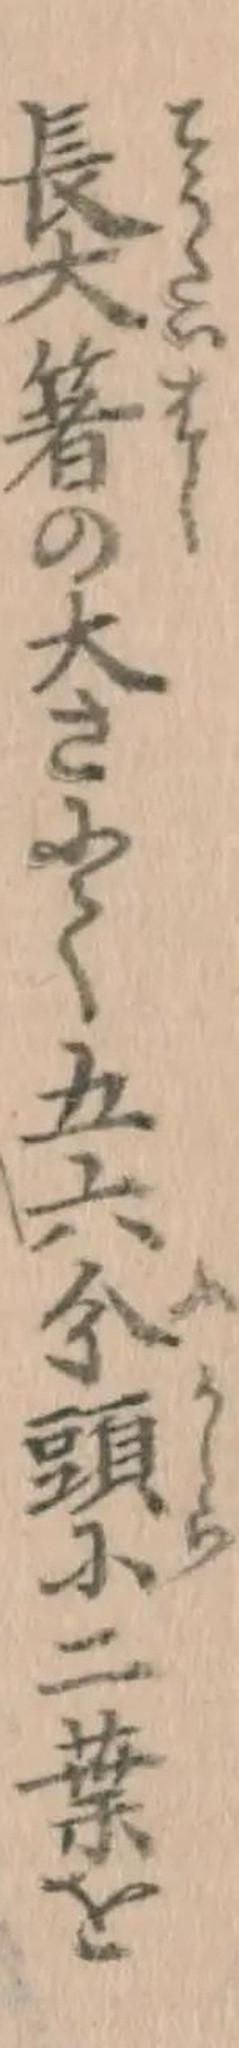長大箸の大さにて五六分頭に二葉を
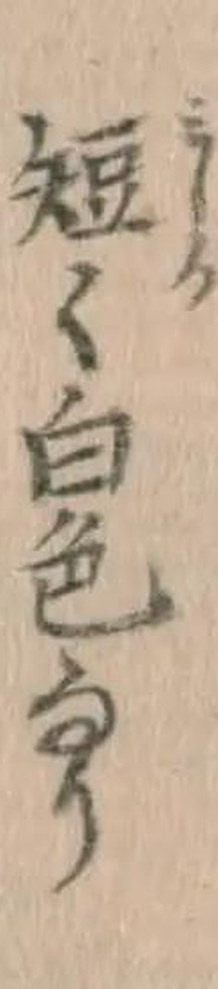短く白色なり
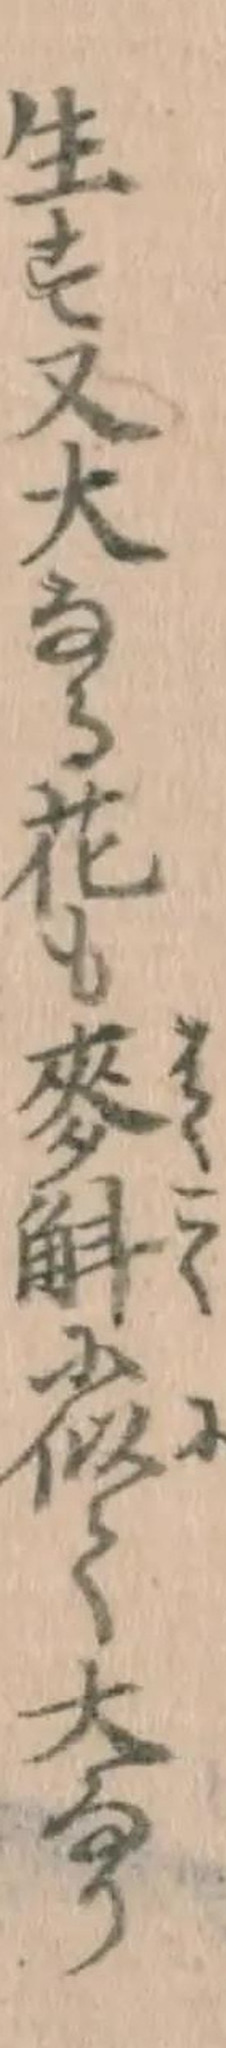生す又大なる花も麦斛に似て大なり

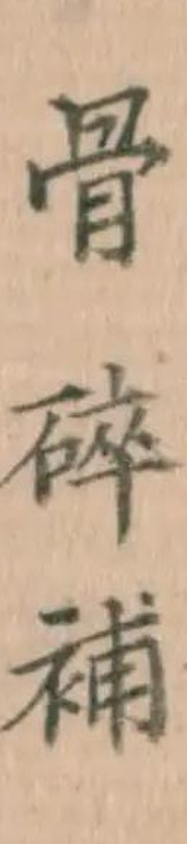骨砕補
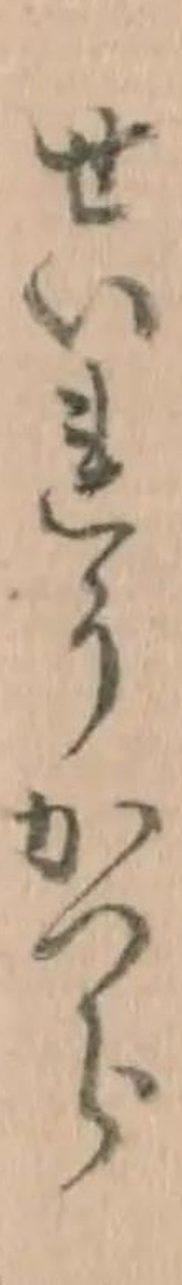せいれうかつら
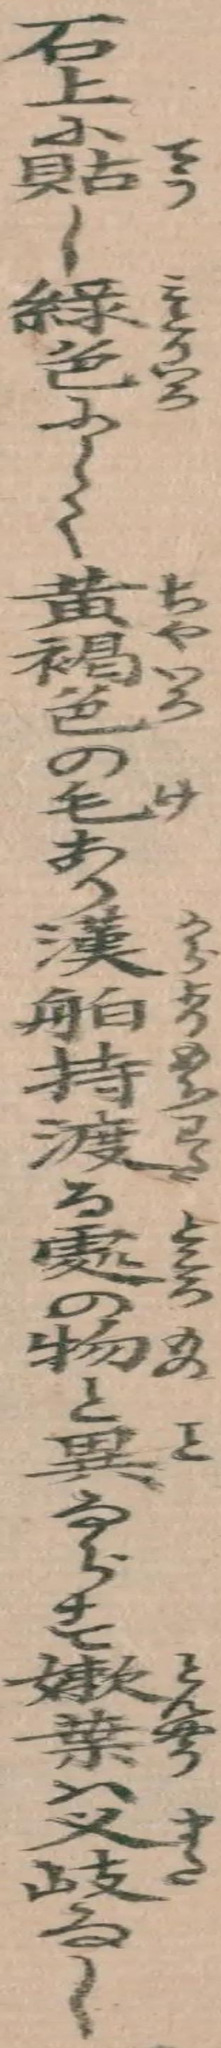石上に貼し緑色にして黄褐色の毛あり漢舶持渡る処の物と異ならす嫩葉は叉岐なし
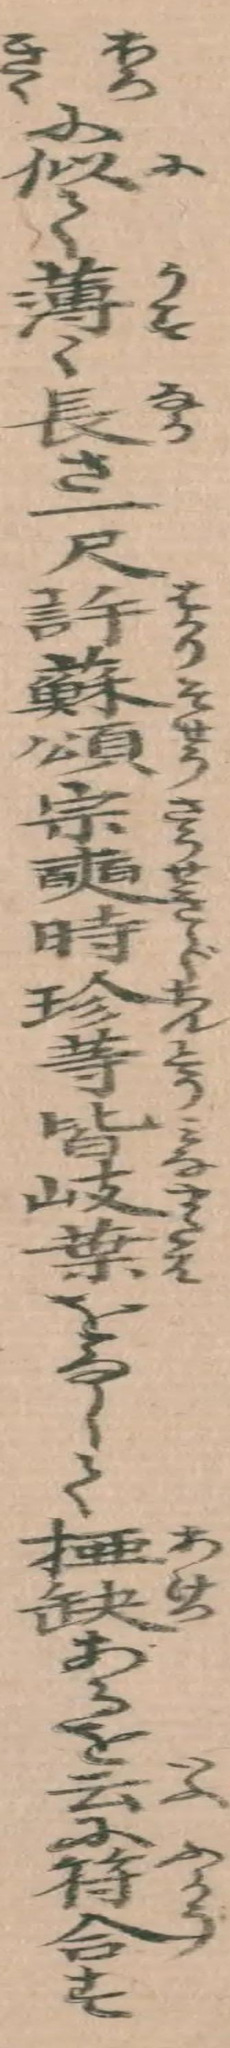ほろきくに似て薄く長さ一尺許蘇頌宗奭時珍等皆岐葉をなして椏欠あるを云に符合す
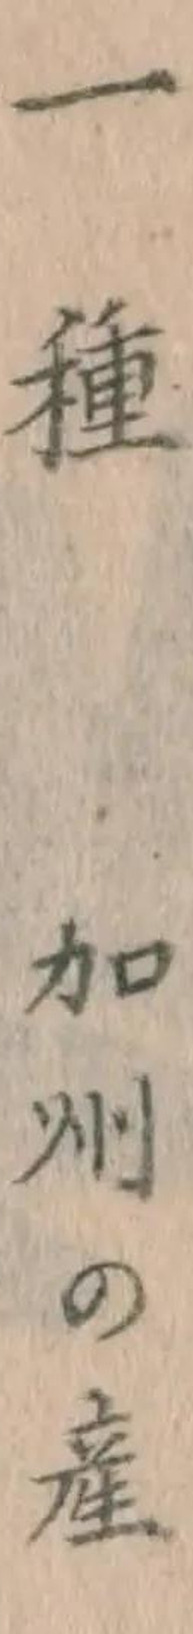一種加州の産
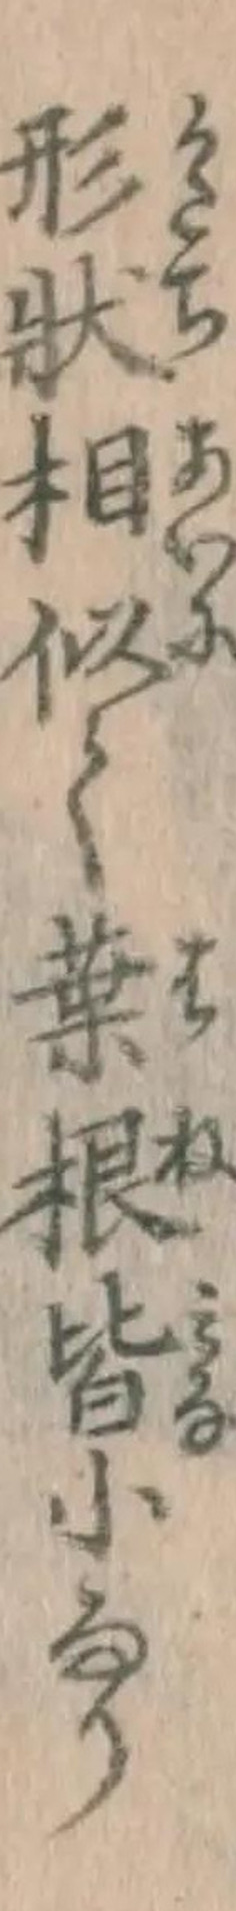形状相似て葉根皆小なり

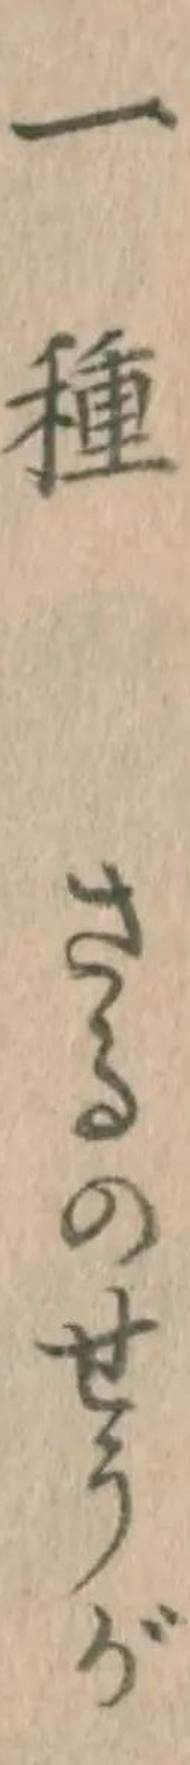一種さるのせうが
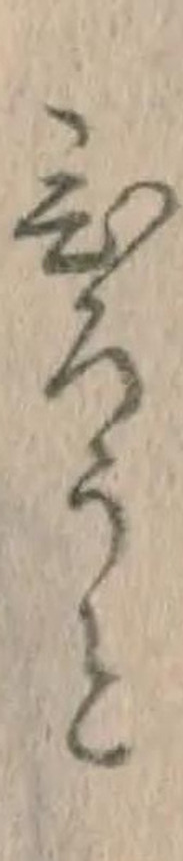ひろうと
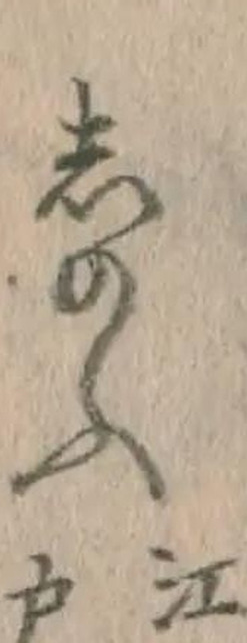しのふ
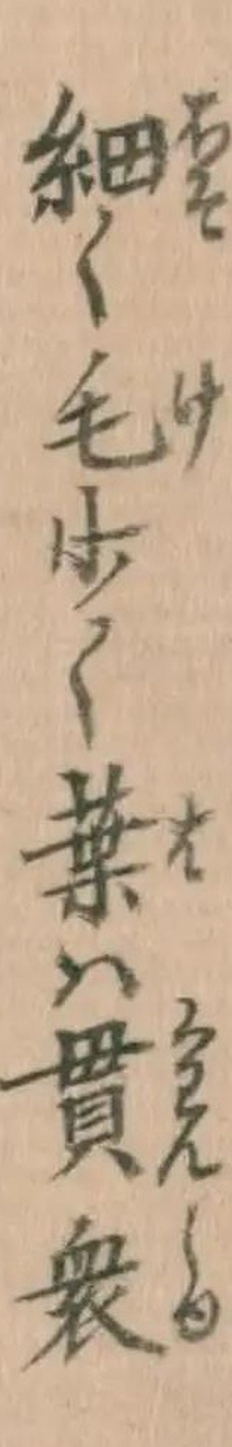細く毛少く葉は貫衆
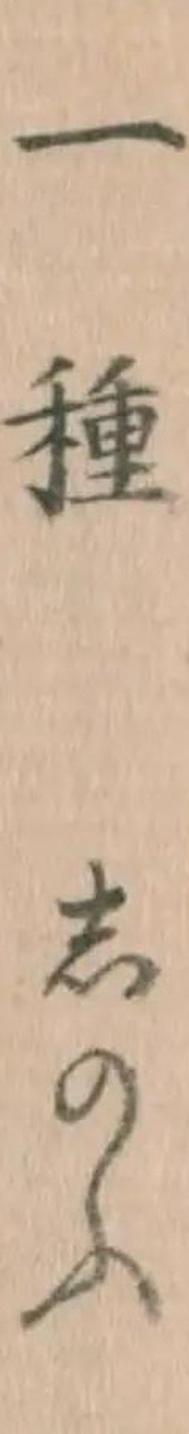一種しのふ
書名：本草図譜. 巻34-36
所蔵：国立国会図書館 National Diet Library, JAPAN
